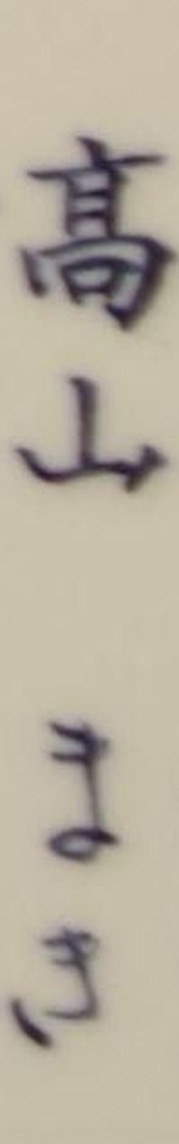高山まき
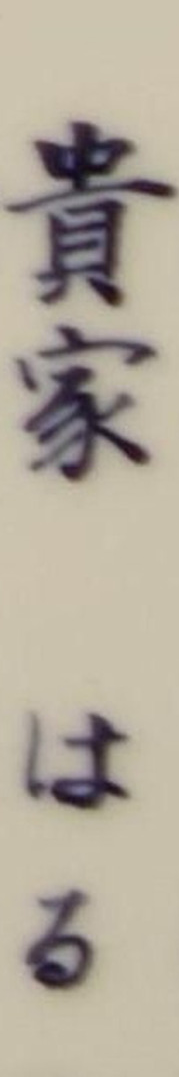貴家はる
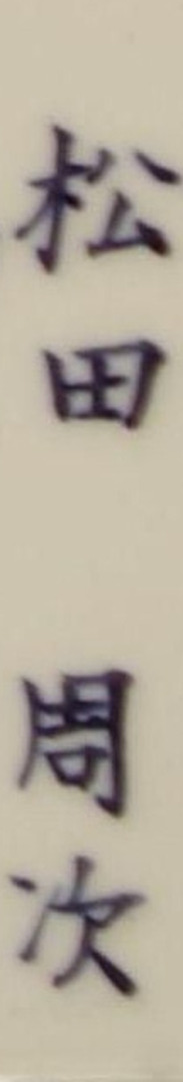松田周次
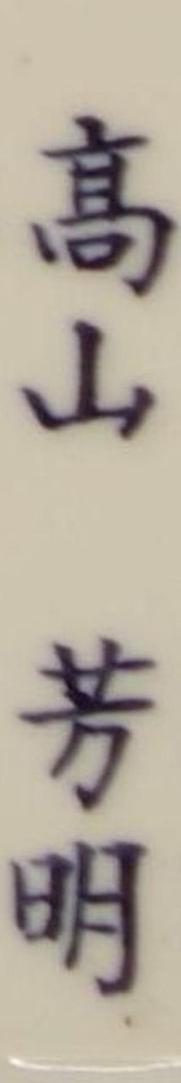高山芳明
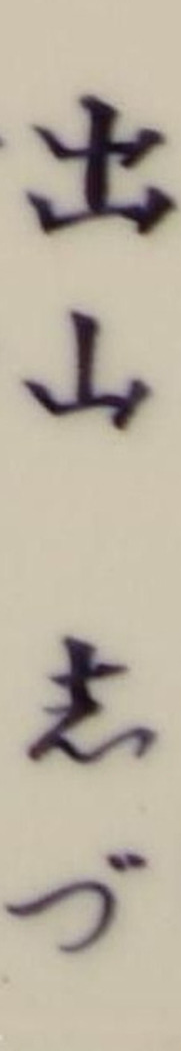出山しづ
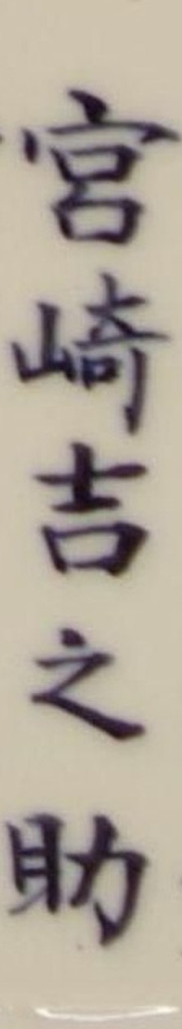宮崎吉之助
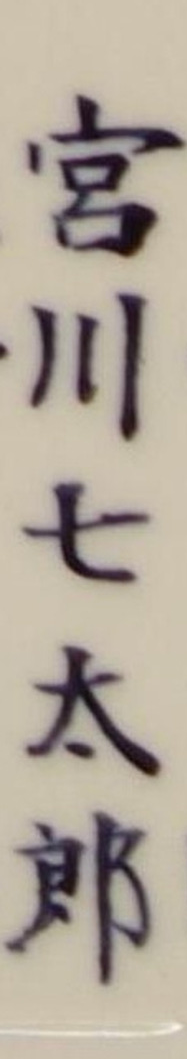宮川七太郎
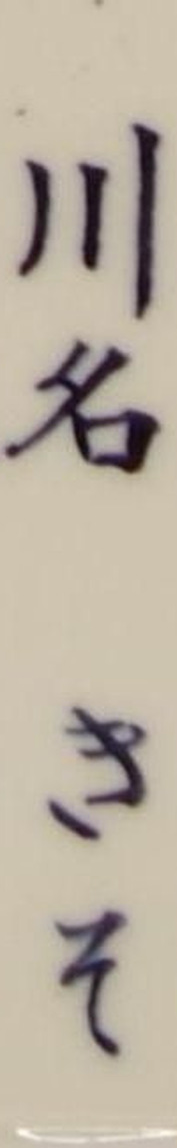川名きそ
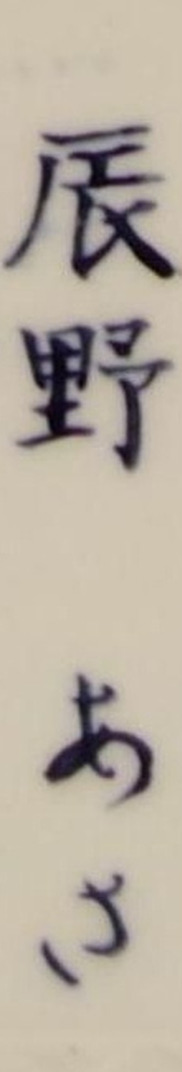辰野あさ
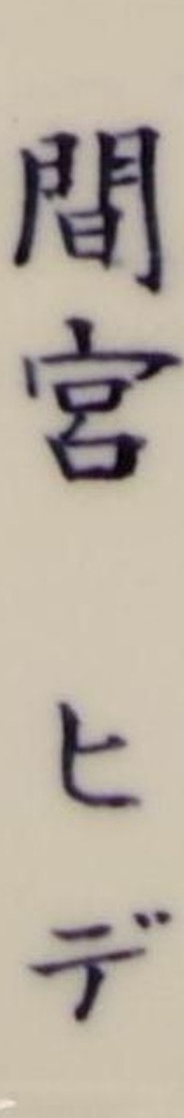間宮ヒデ
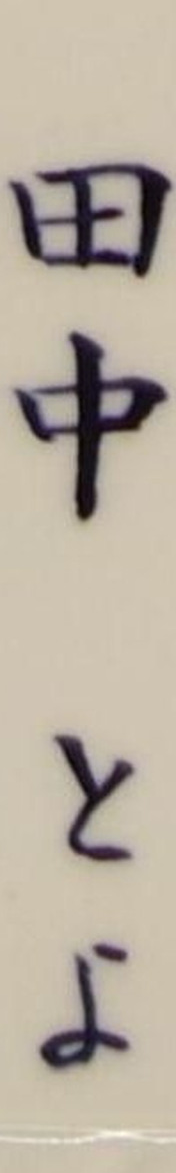田中とよ
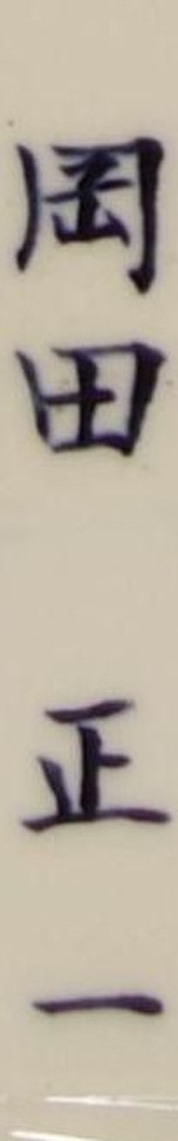岡田正一
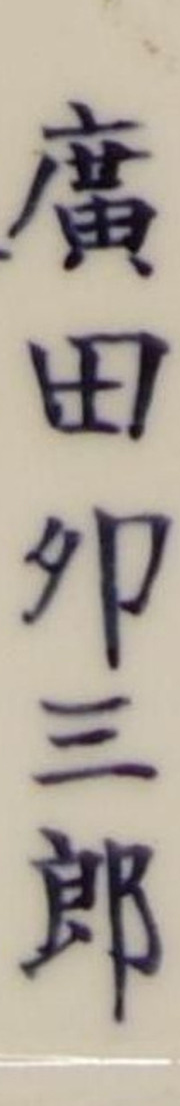廣田卯三郎
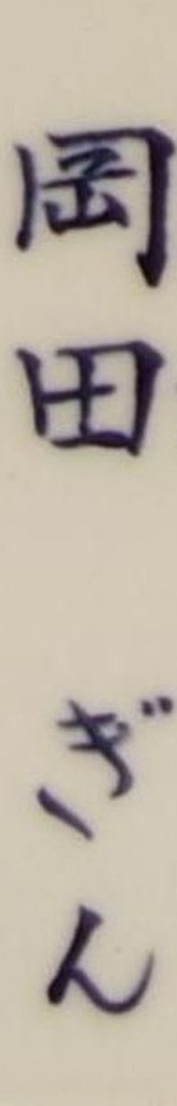岡田ぎん
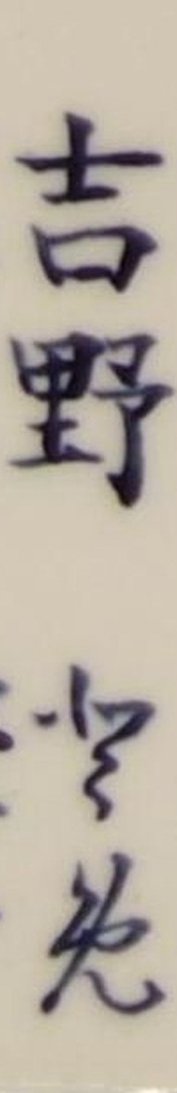吉野とめ
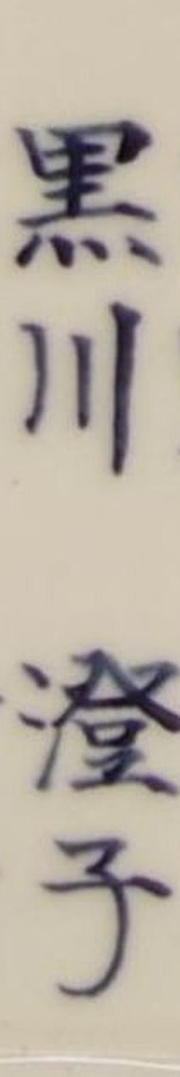黒川澄子
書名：M~S
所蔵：高野山金剛峯寺
